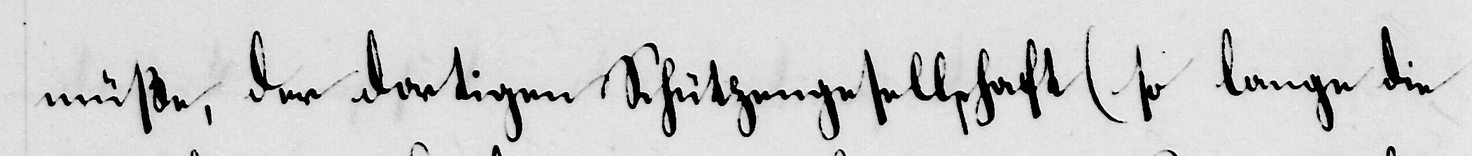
müße, der dortigen Schützengesellschaft (so lange die
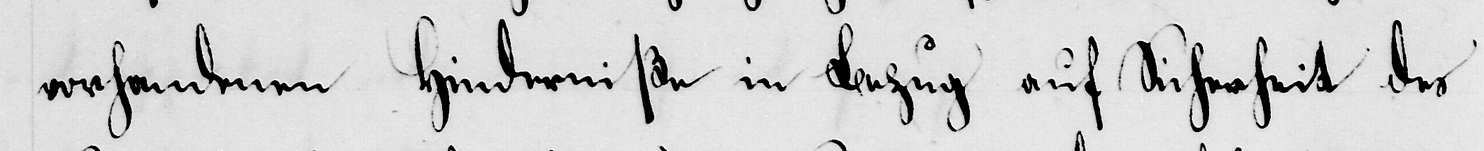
vorhandenen Hinderniße in Bezug auf Sicherheit des
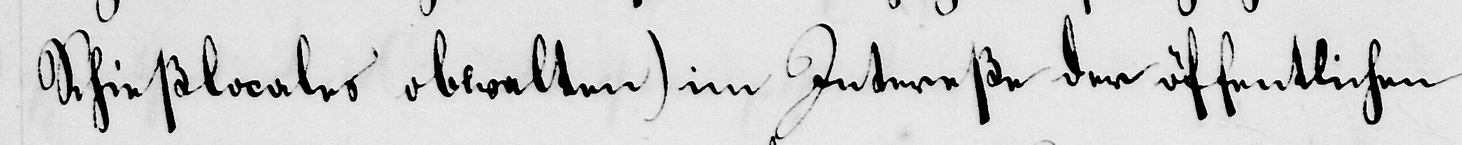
Schießlocales obwalten) im Intereße der öffentlichen
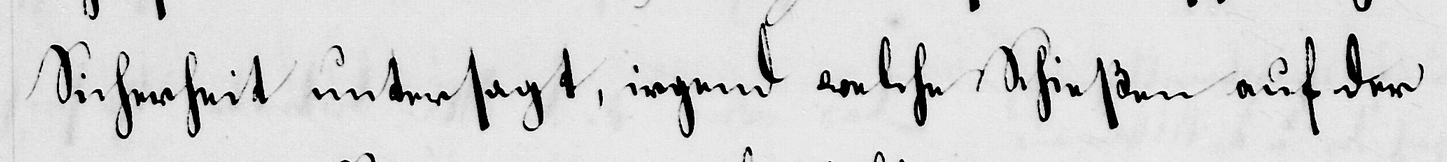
Sicherheit untersagt, irgend welche Schießen auf der
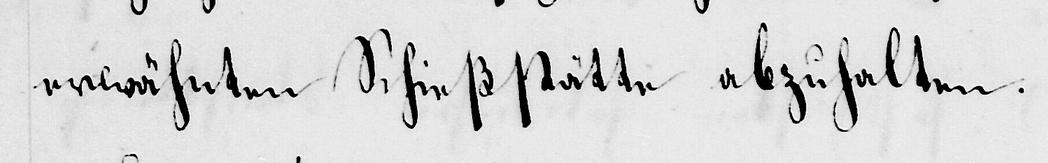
erwähnten Schießstätte abzuhalten.
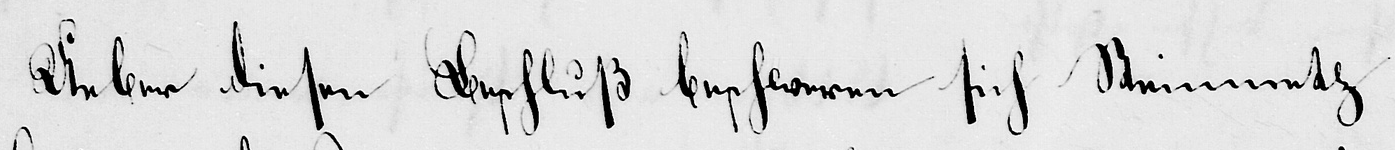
Ueber diesen Beschluß beschweren sich Steinmetz
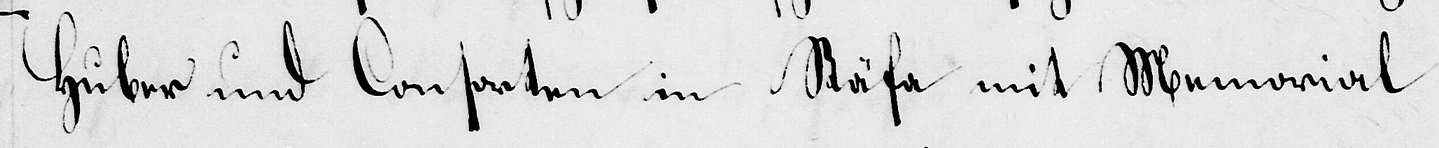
Huber und Consorten in Stäfa mit Memorial
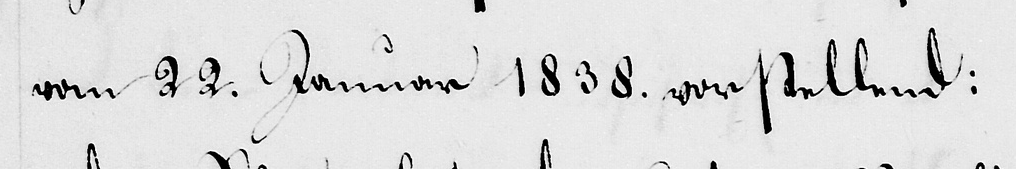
vom 22. Januar 1838. vorstellend:
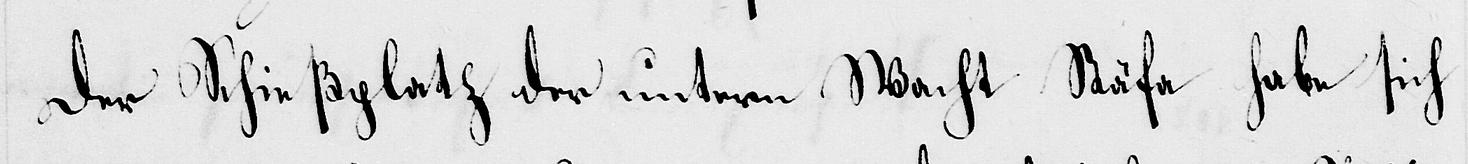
Der Schießplatz der untern Wacht Stäfa habe sich
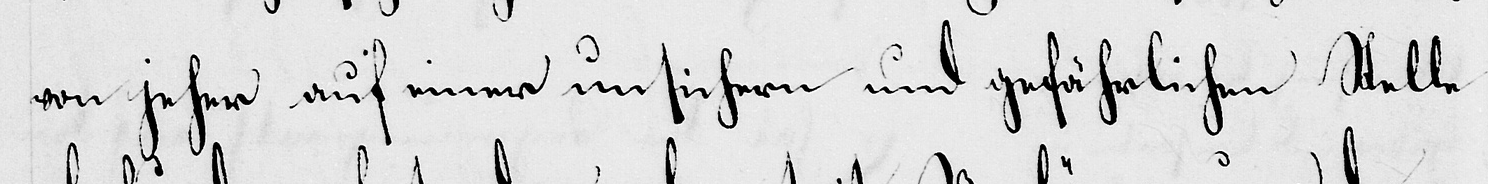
von jeher auf einer unsichern und gefährlichen Stelle
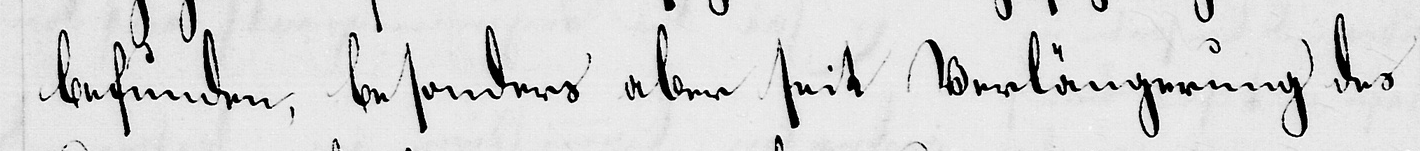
befunden, besonders aber seit Verlängerung des
